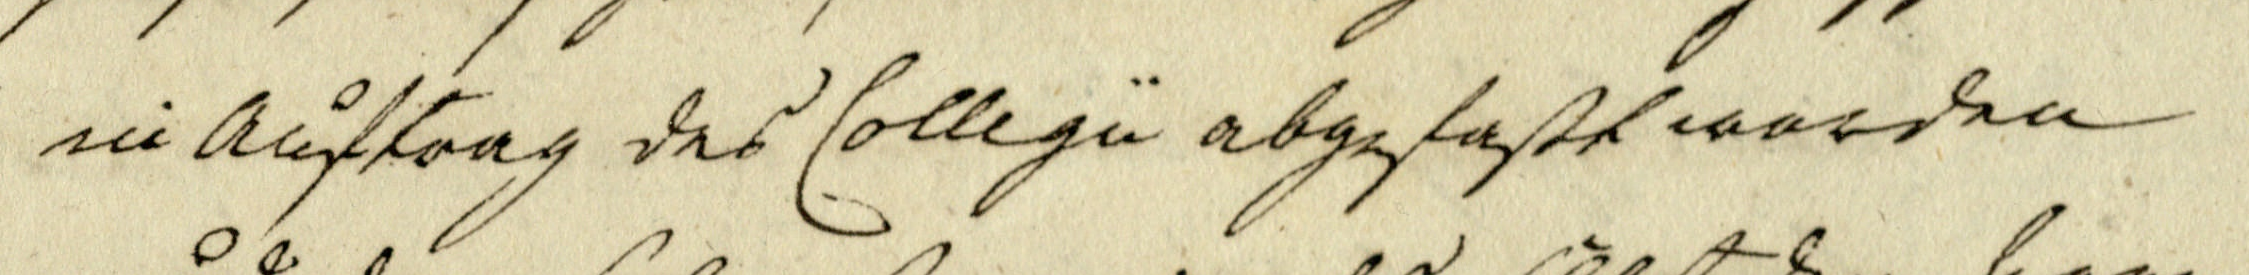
in Auftrag des Collegii abgefaßt worden
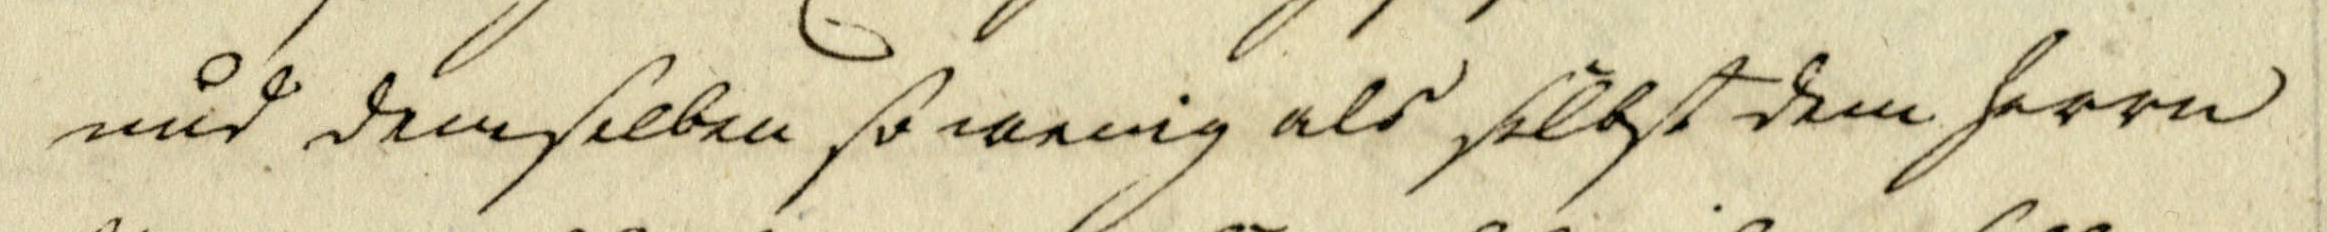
und demselben so wenig als selbst dem Herrn
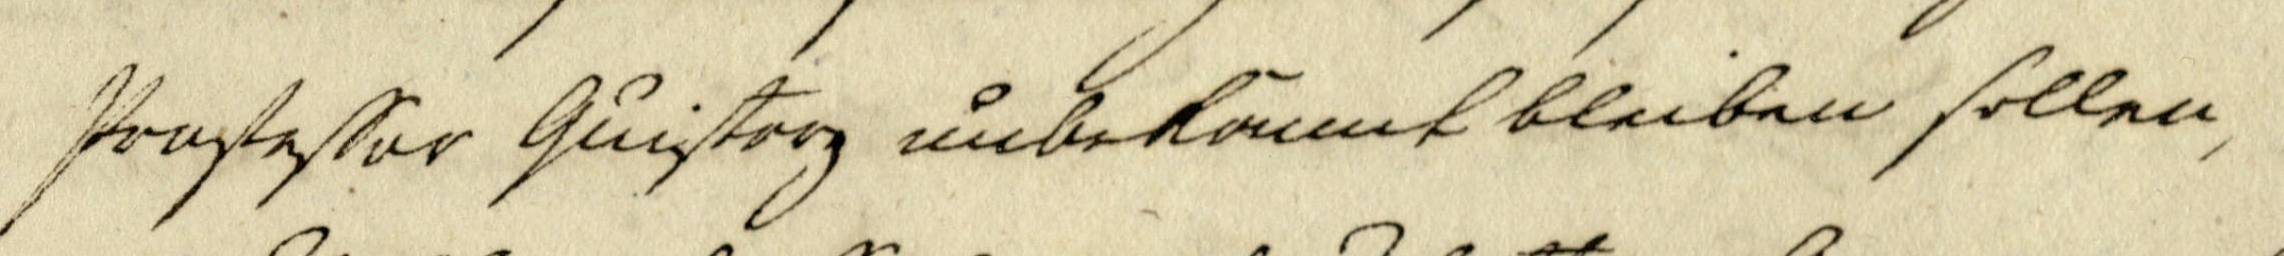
Professor Quistorp unbekannt bleiben sollen,
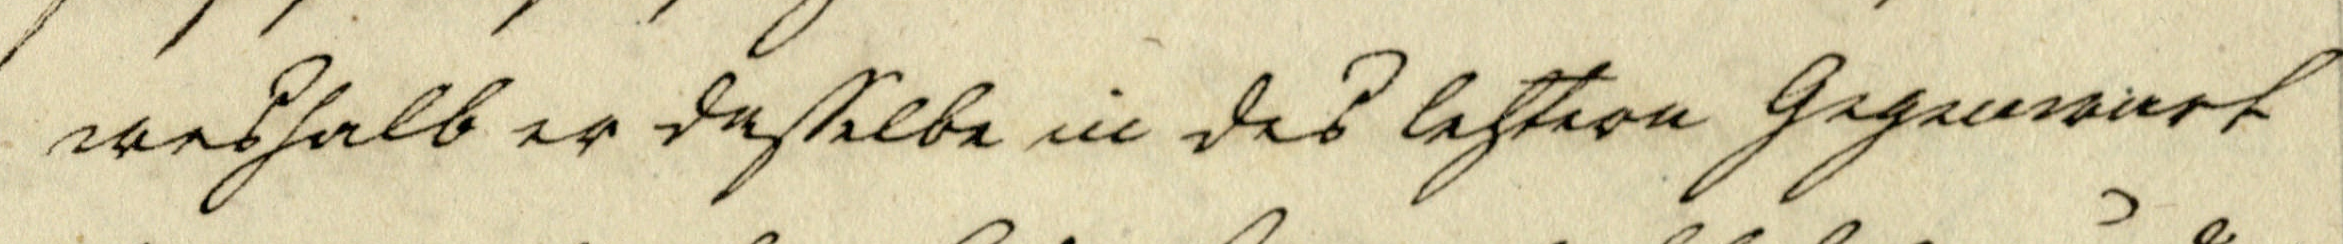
weshalb er dasselbe in des letztern Gegenwart
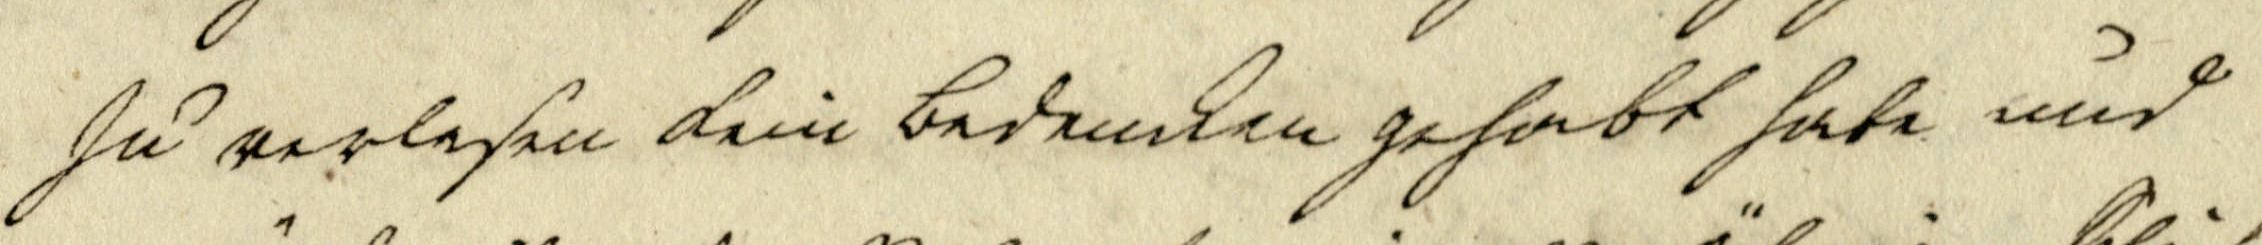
zu verlesen kein Bedencken gehabt habe und
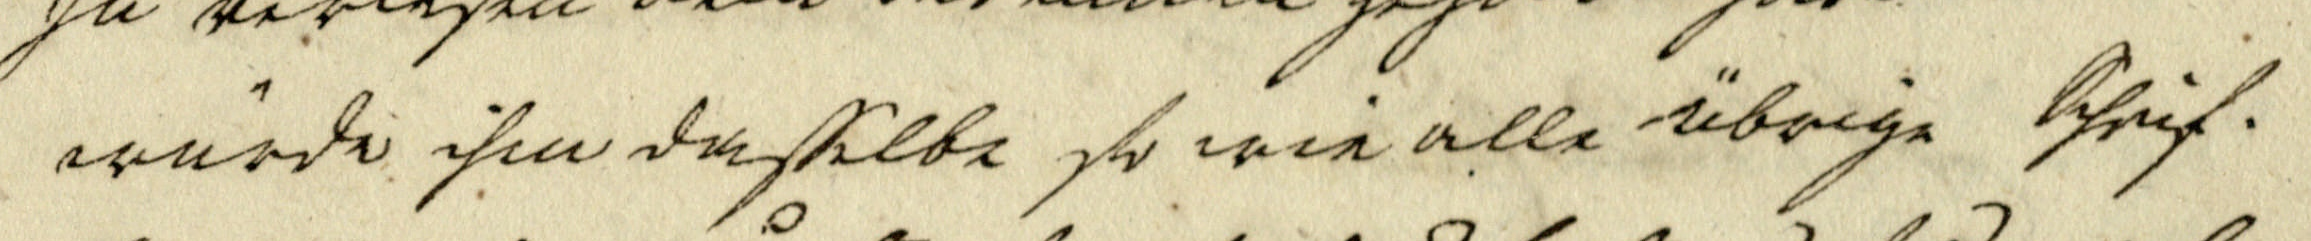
würde ihm dasselbe so wie alle übrige Schrif¬
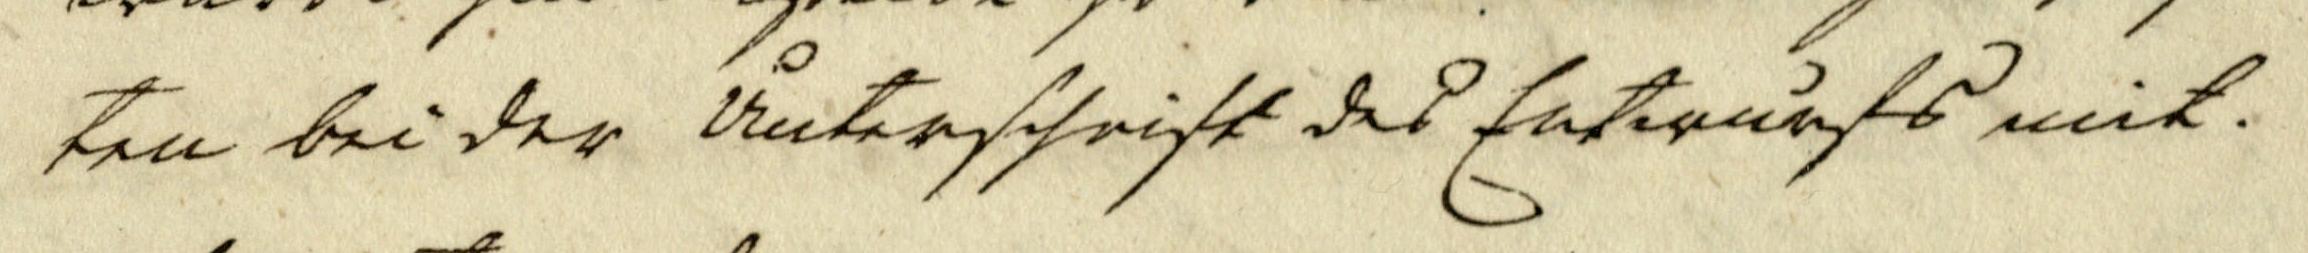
ten bei der Unterschrift des Entwurfs mit¬
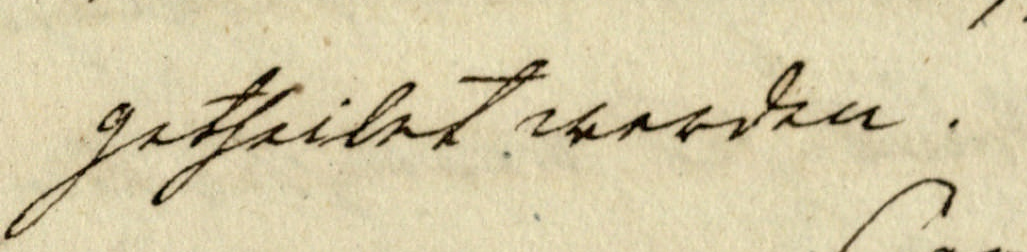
getheilet werden.
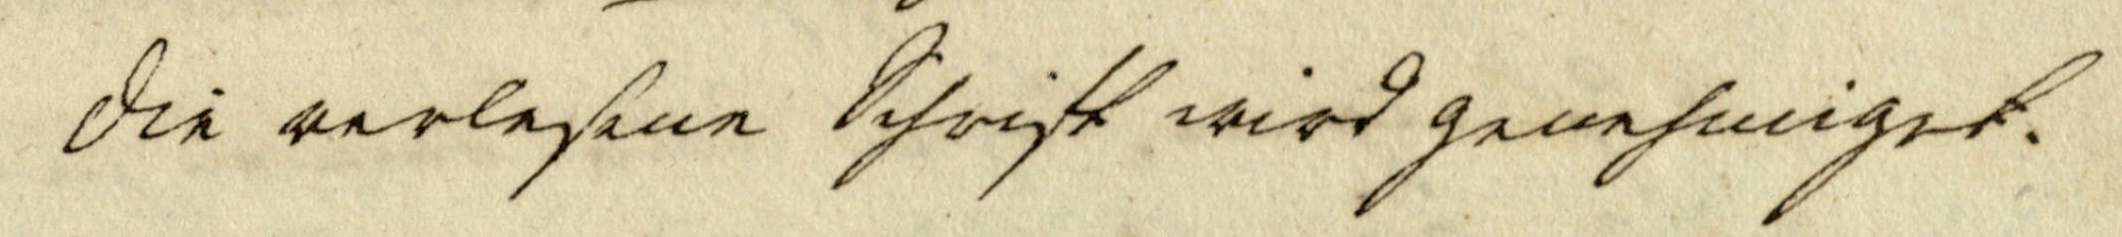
Die verlesene Schrift wird genehmiget.
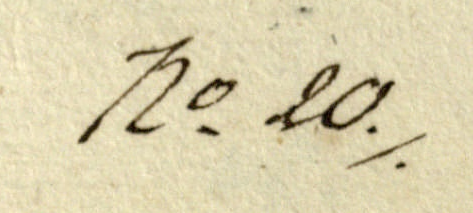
No 20.
